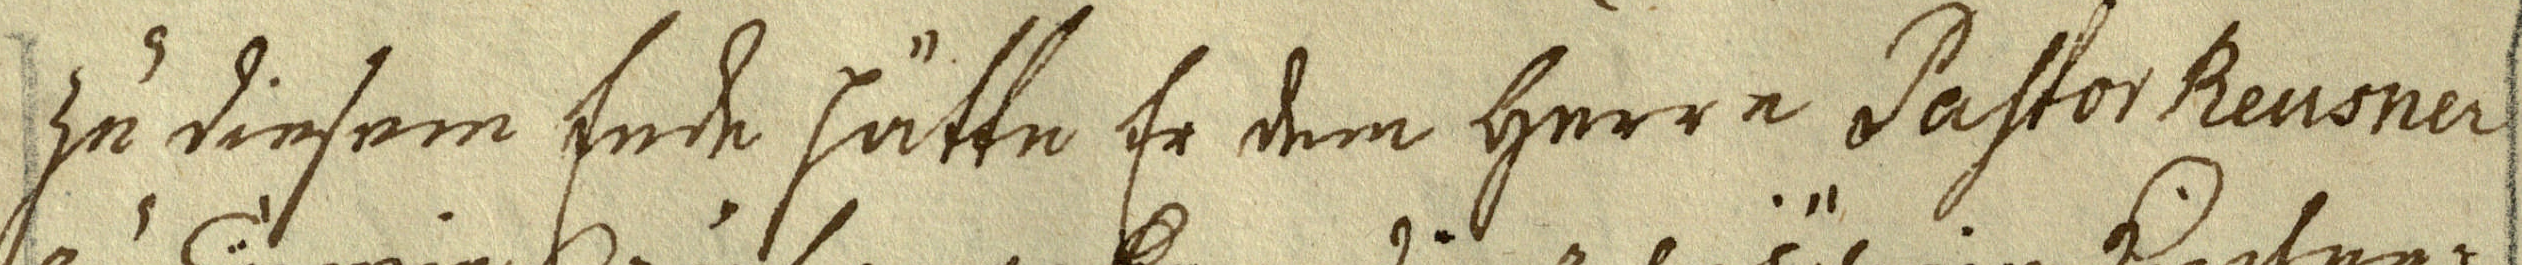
Zu diesem Ende hätte Er dem Herrn dem Pastor Reusner
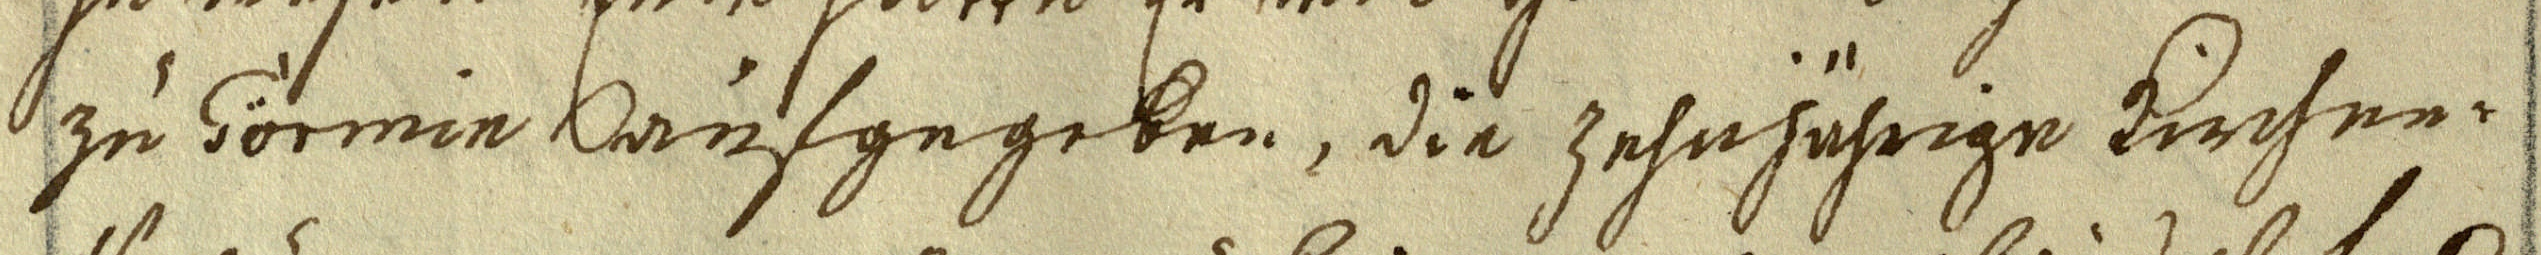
zu Görmin aufgegeben, die zehnjährige Kirchen¬
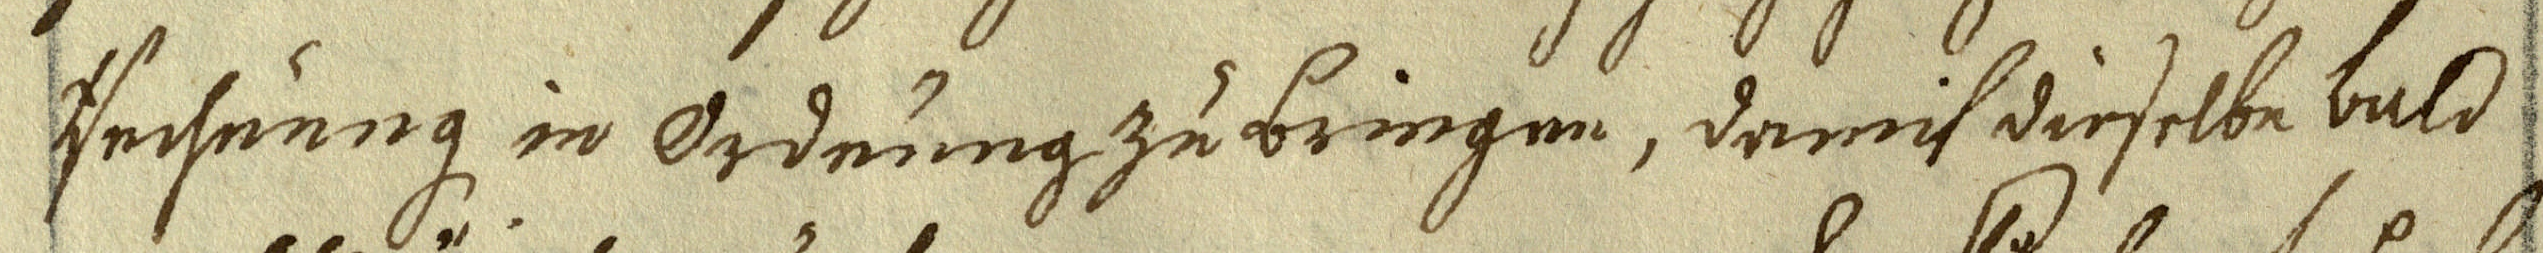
Rechnung in Ordnung zu bringen, damit dieselbe bald
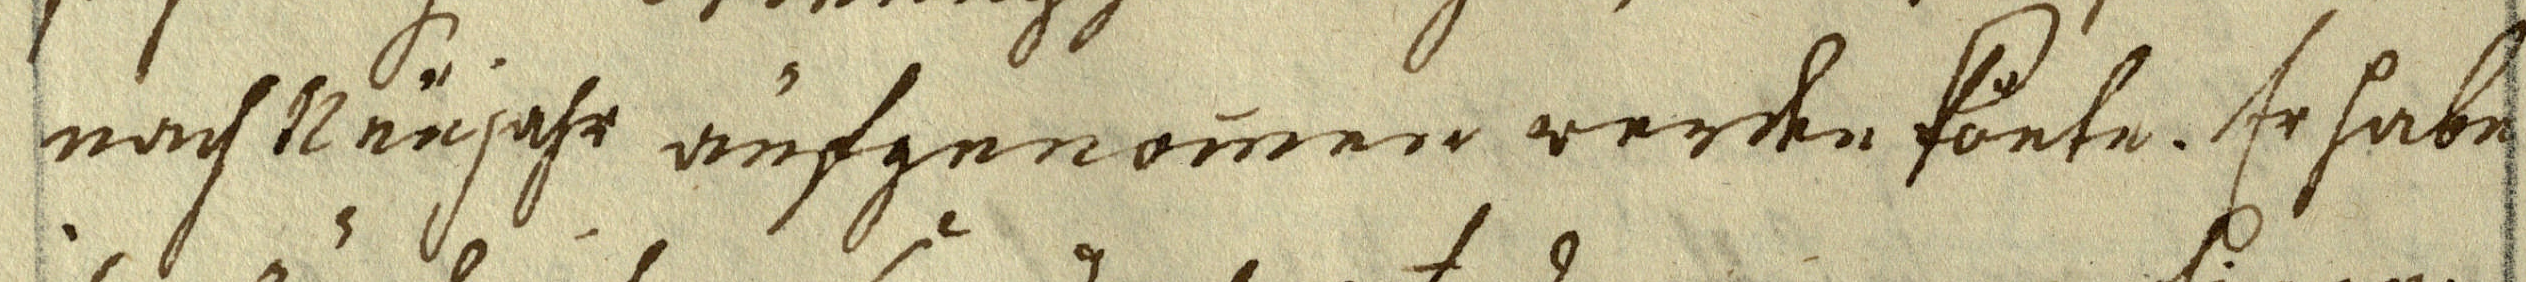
nach Neujahr aufgenomen werden könte. Er habe
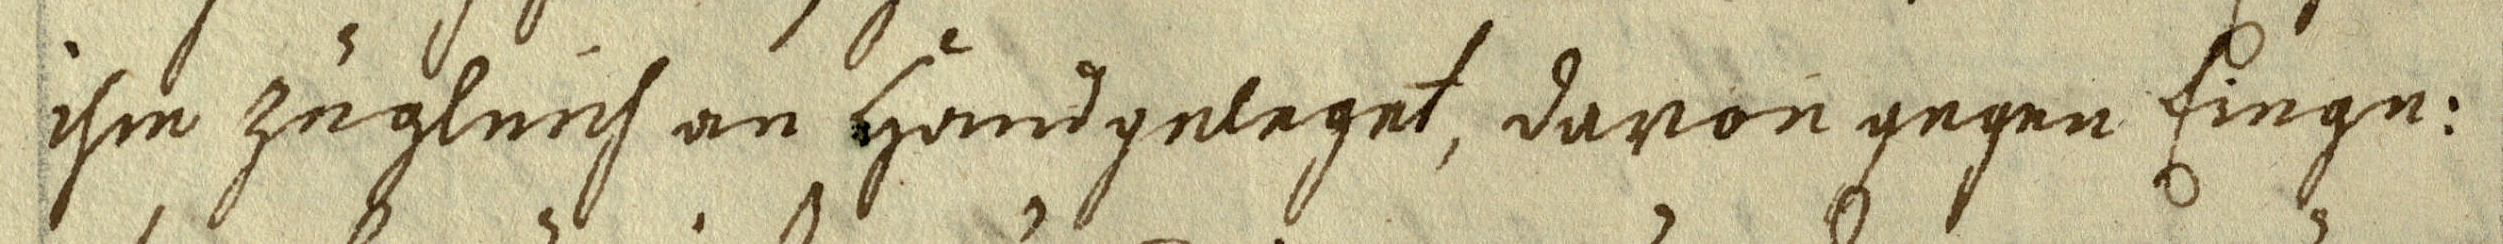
ihm zugleich an Hand geleget, davon gegen Einge¬
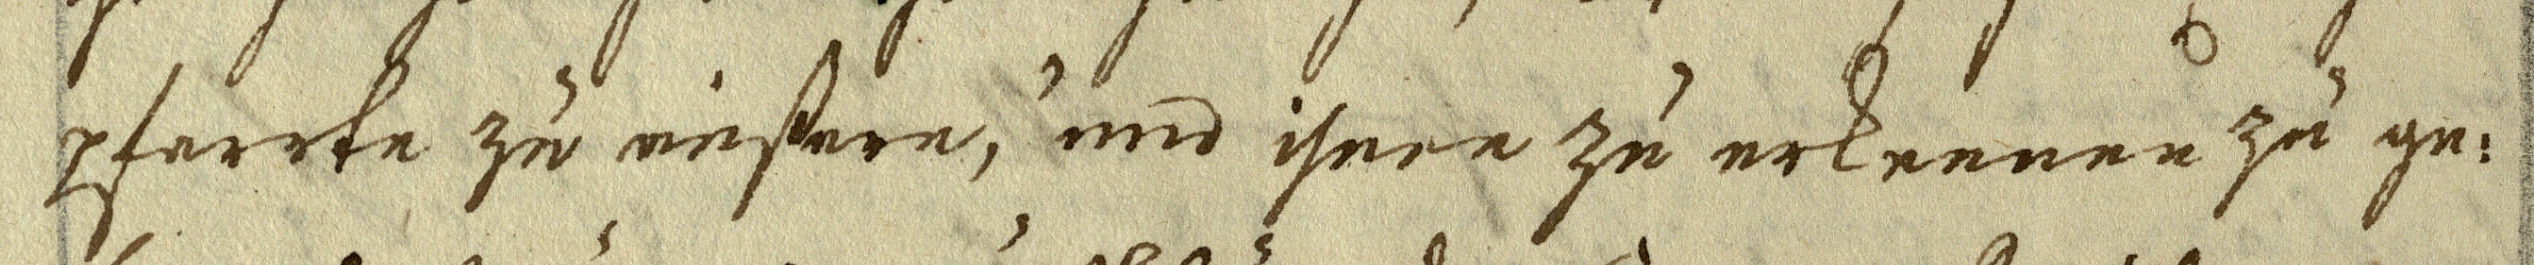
pfarrte zu äußern, und ihnen zu erkennen zu ge¬
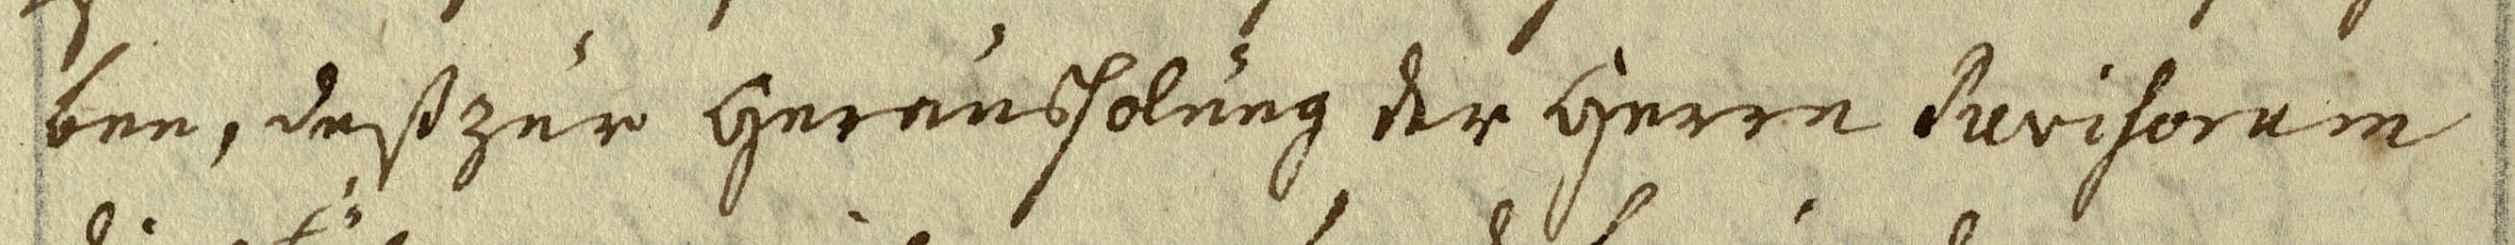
ben, daß zur Herausholung der Herrn Revisorum
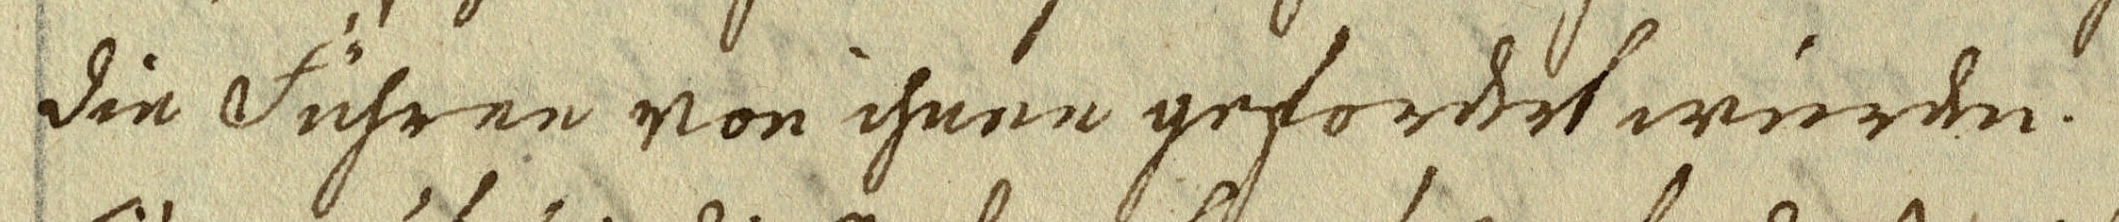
die Fuhren von ihnen gefordert würden.
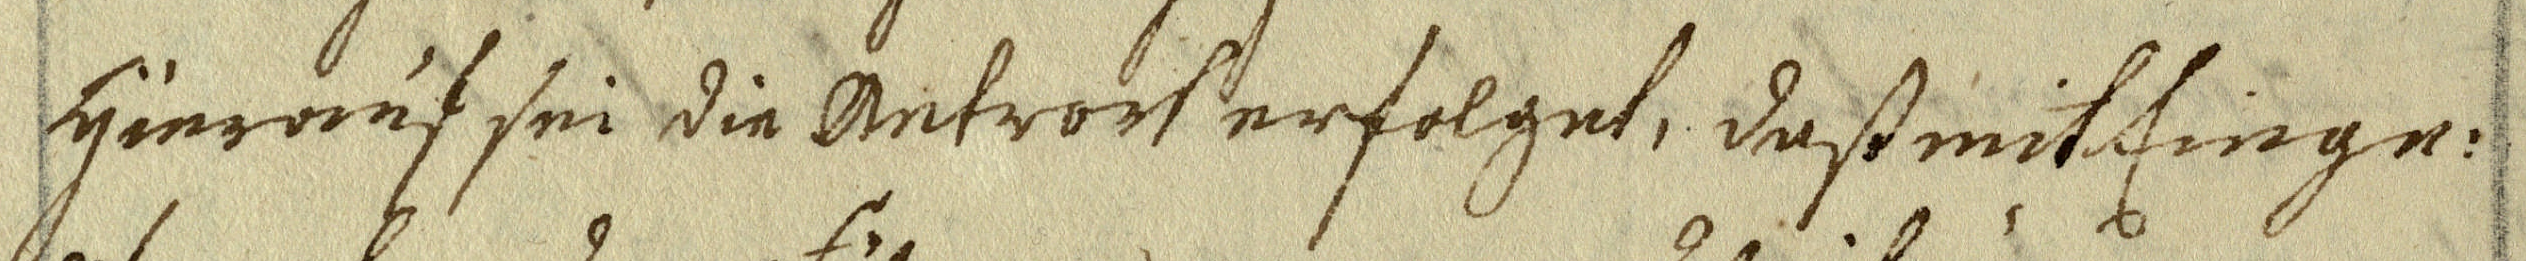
Hierauf sei die Antwort erfolget, daß mit Einge¬
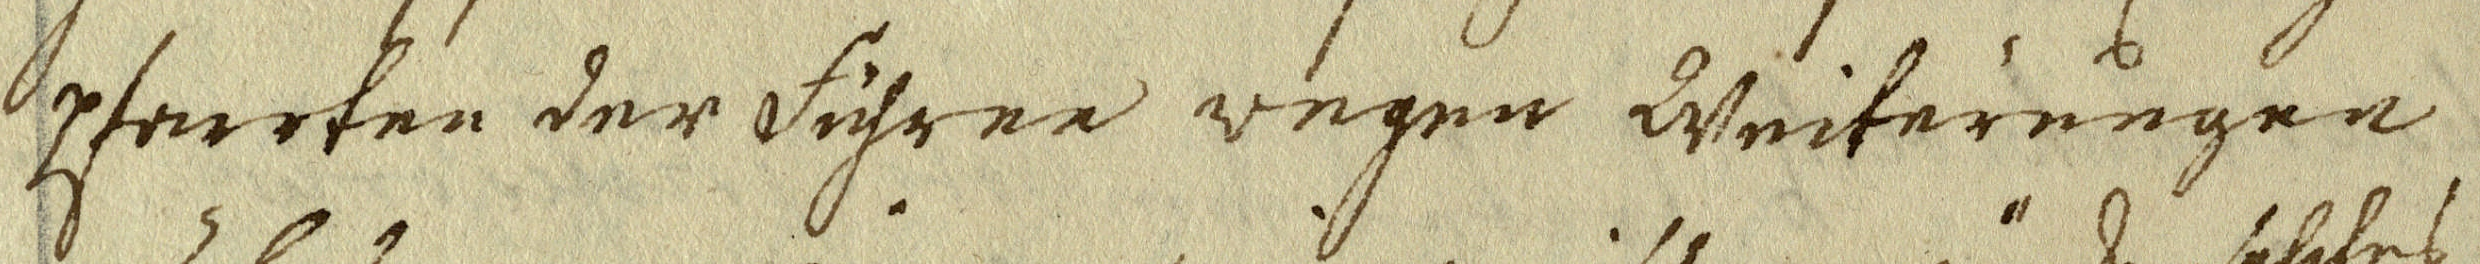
pfarrten der Fuhren wegen Weiterungen
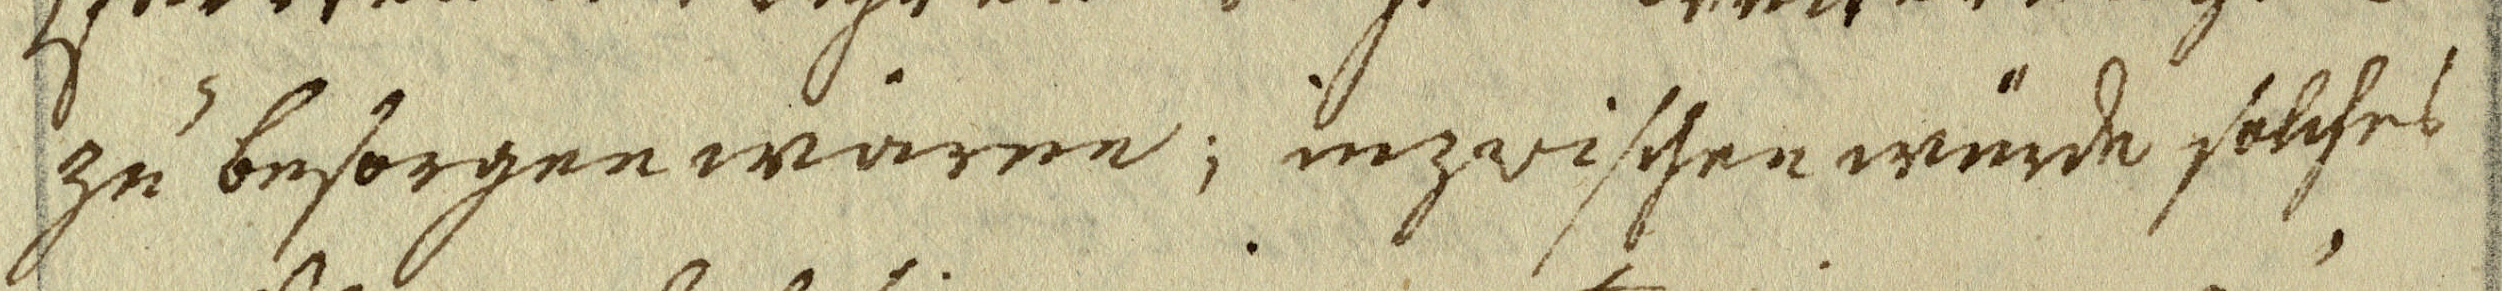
zu besorgen wären; inzwischen würde solches
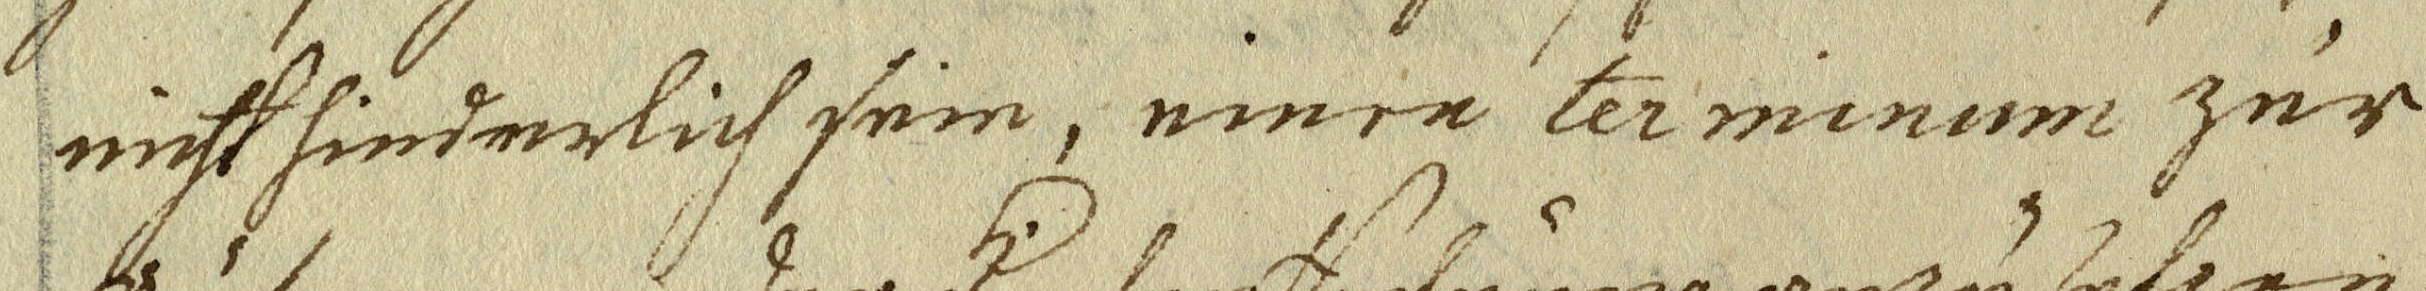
nicht hinderlich sein, einen terminum zur
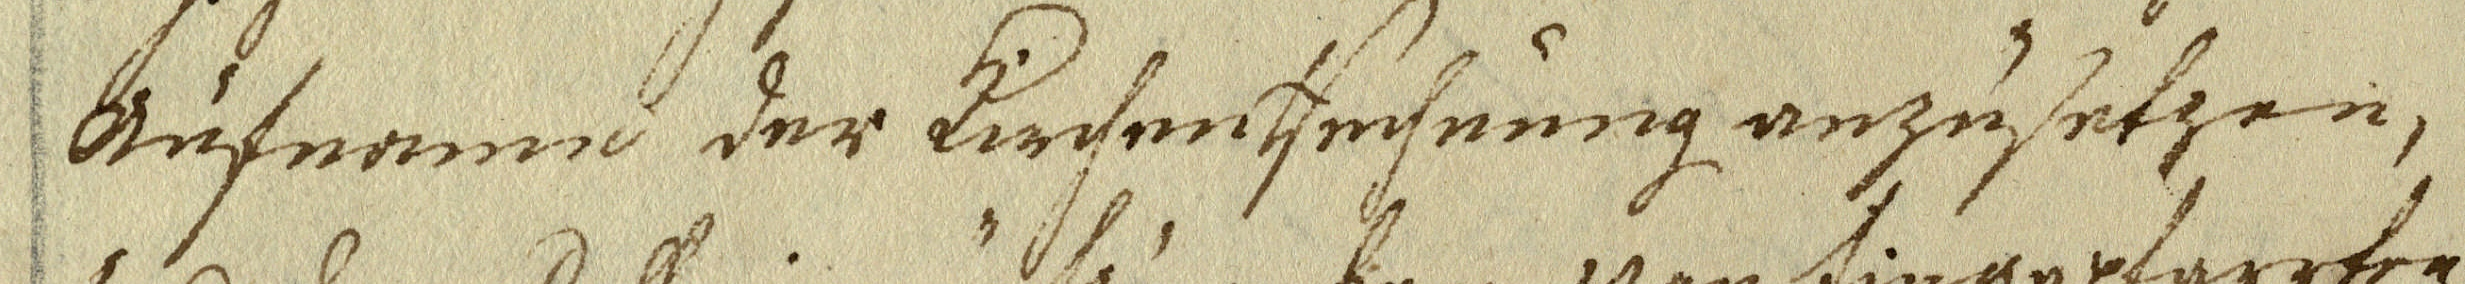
Aufname der Kirchen Rechnung anzusetzen,
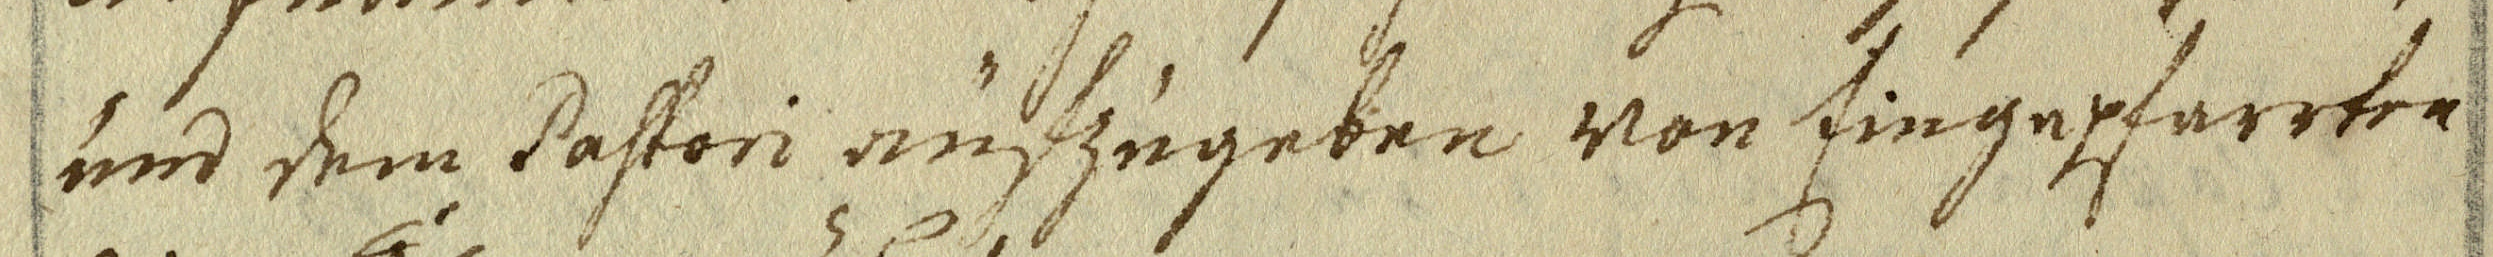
und dem Pastori aufzugeben von Eingepfarrten
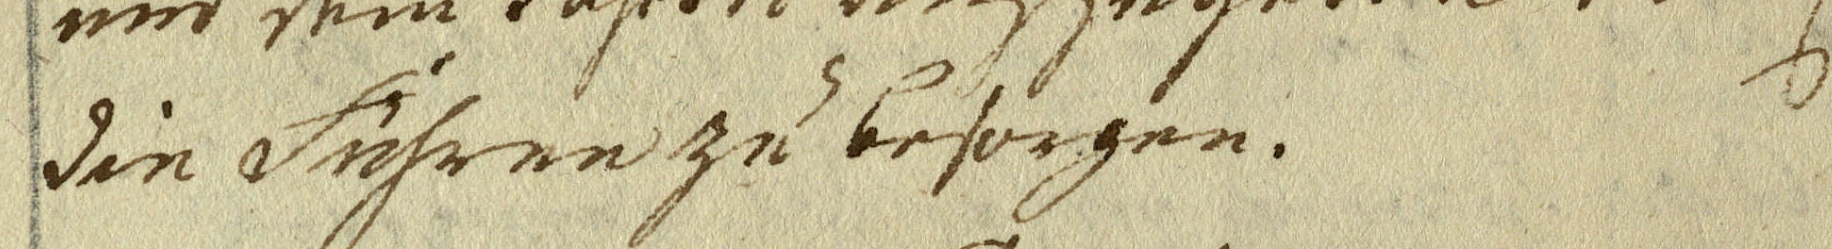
die Fuhren zu besorgen.
